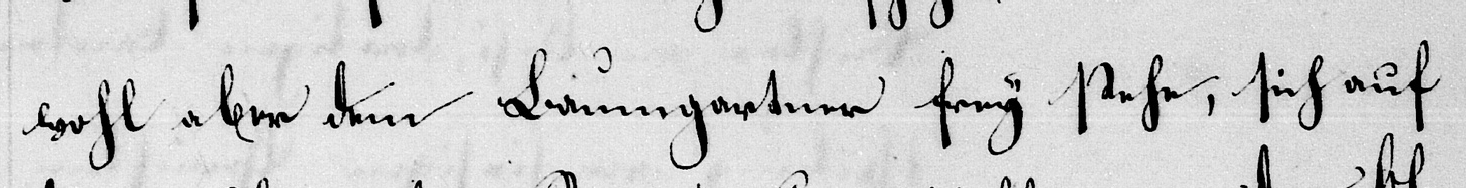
wohl aber dem Baumgartner frey stehe, sich auf
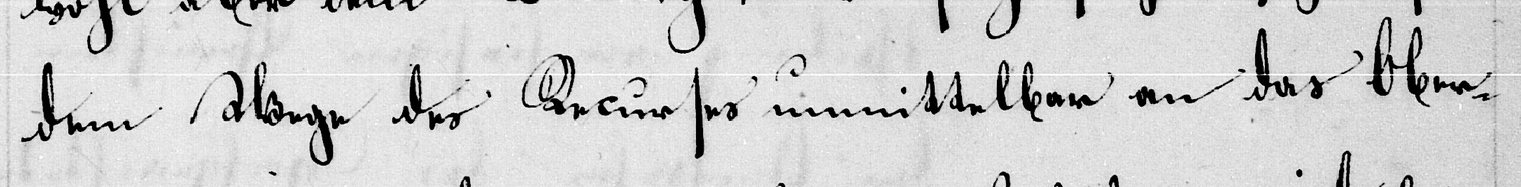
dem Wege des Recurses unmittelbar an das Ober¬
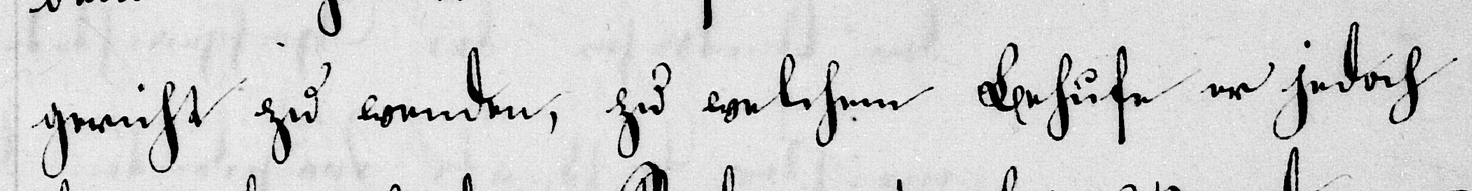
gericht zu wenden, zu welchem Behufe er jedoch
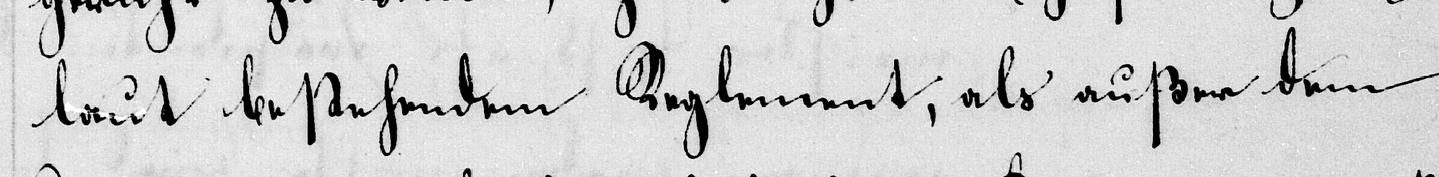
laut bestehendem Reglement, als außer dem
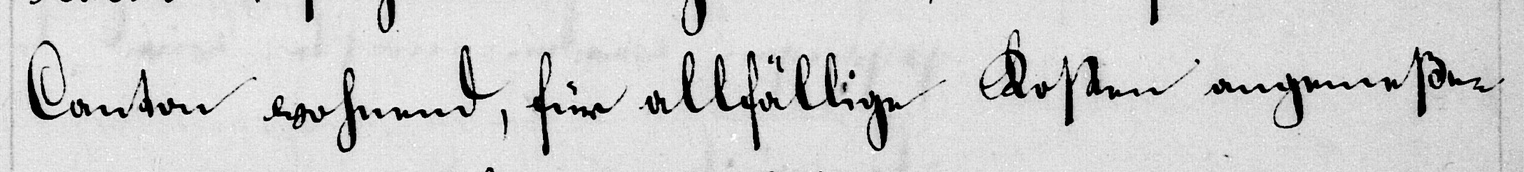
Canton wohnend, für allfällige Kosten angemeße¬
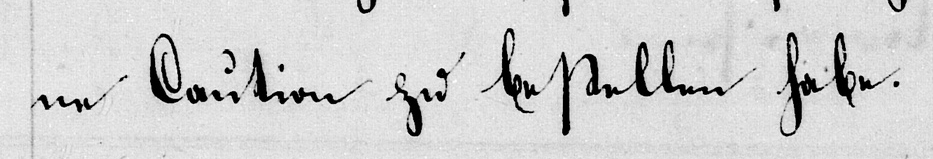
n Caution zu bestellen habe.
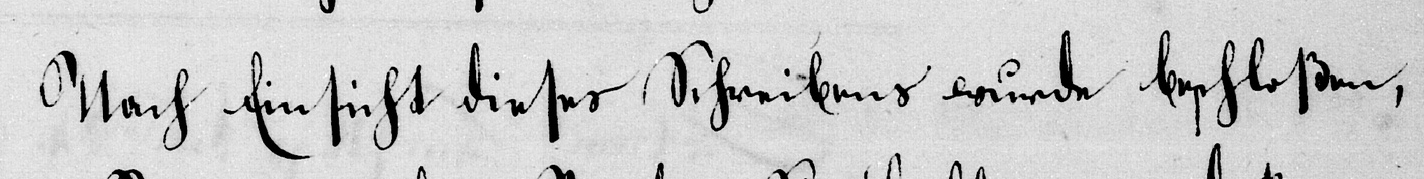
Nach Einsicht dieses Schreibens wurde beschloßen,
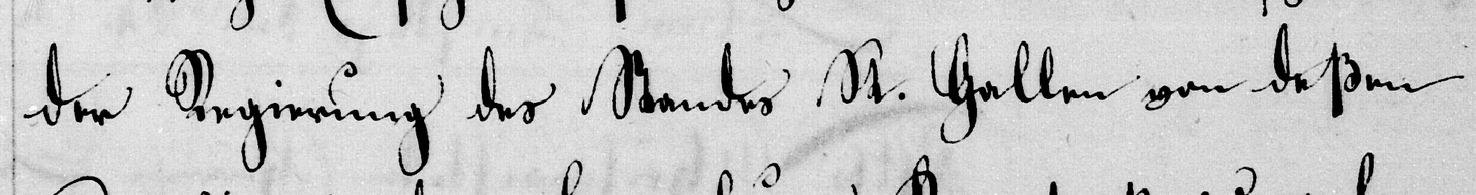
der Regierung des Standes St. Gallen von deßen
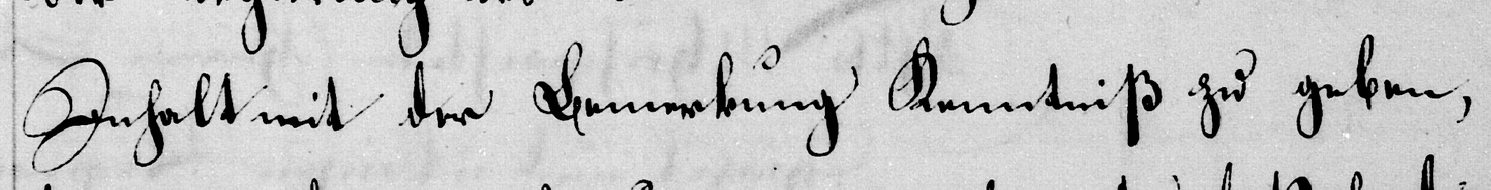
Inhalt mit der Bemerkung Kenntniß zu geben,
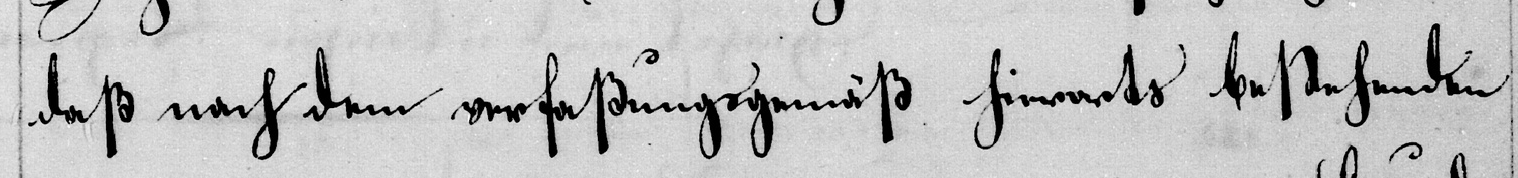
daß nach dem verfaßungsgemäß hierorts bestehenden
